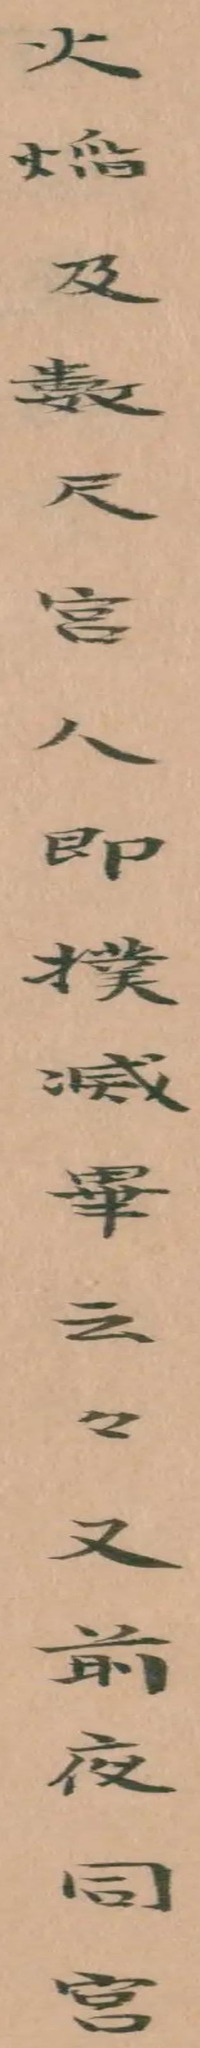火焰及数尺宮人即撲滅畢云々又前夜同宮
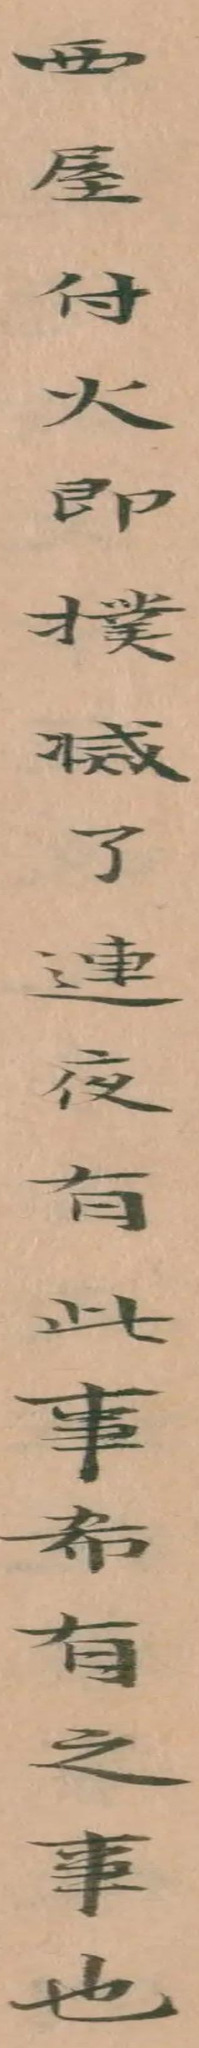西屋付火即撲滅了連夜有此事希有之事也
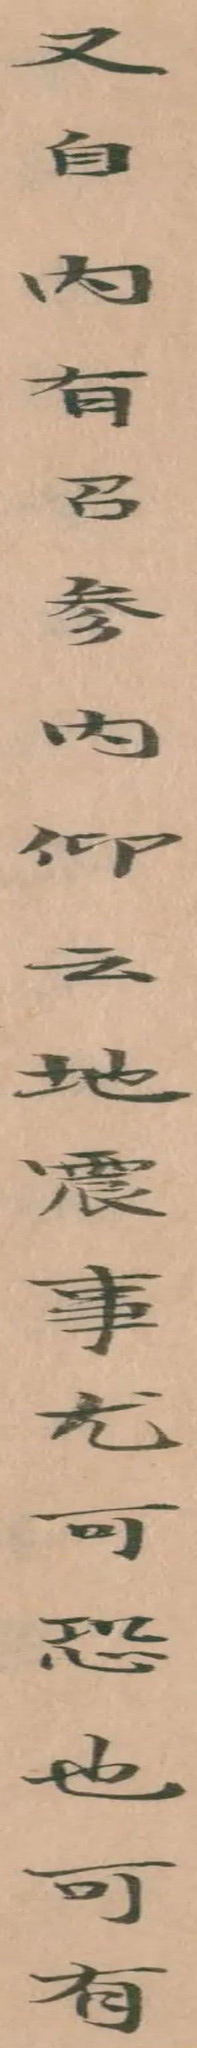又自内有召参内仰云地震事尤可恐也可有
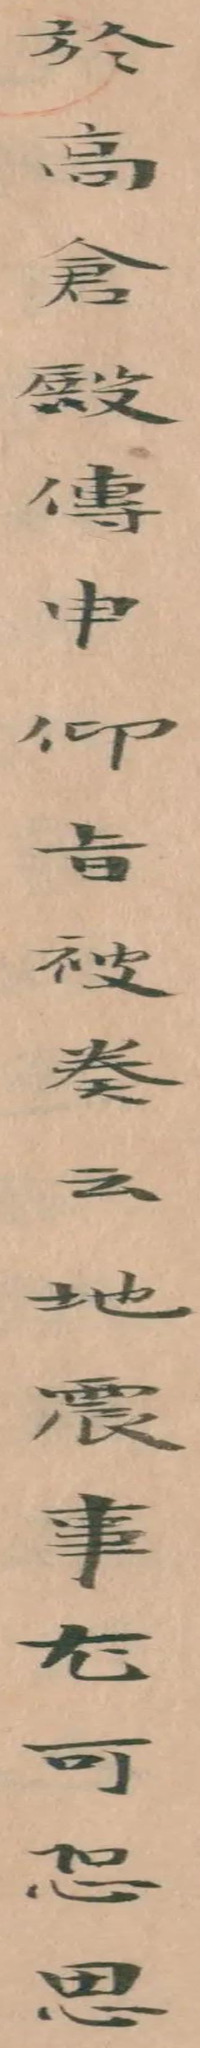於高倉殿伝申仰旨被奏云地震事尤可恐思
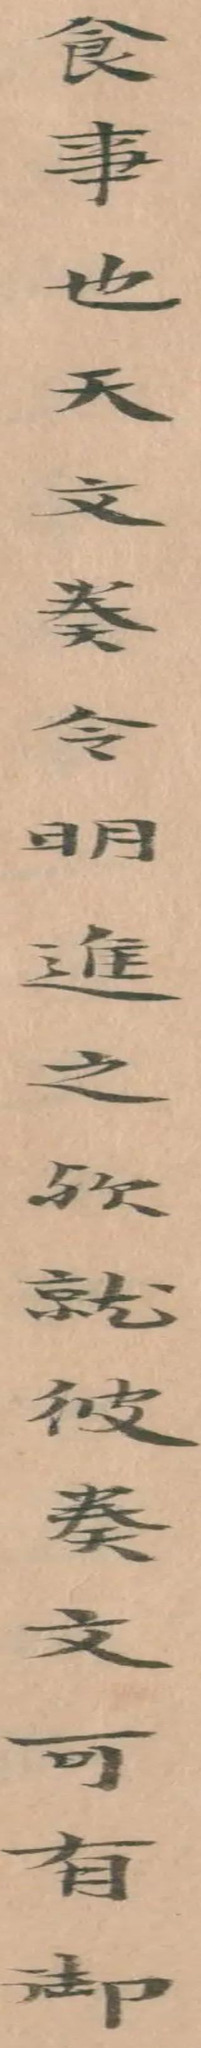食事也天文奏令明進之歟就彼奏文可有御

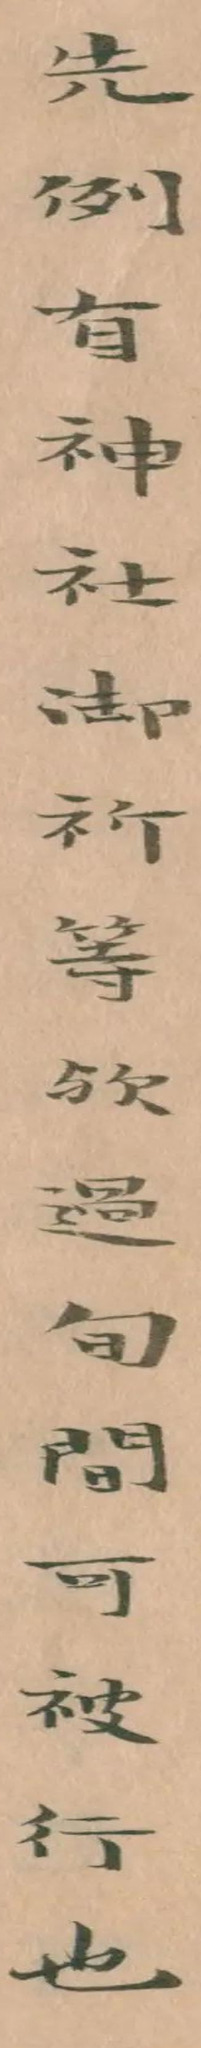先例有神社御祈等歟過旬間可被行也
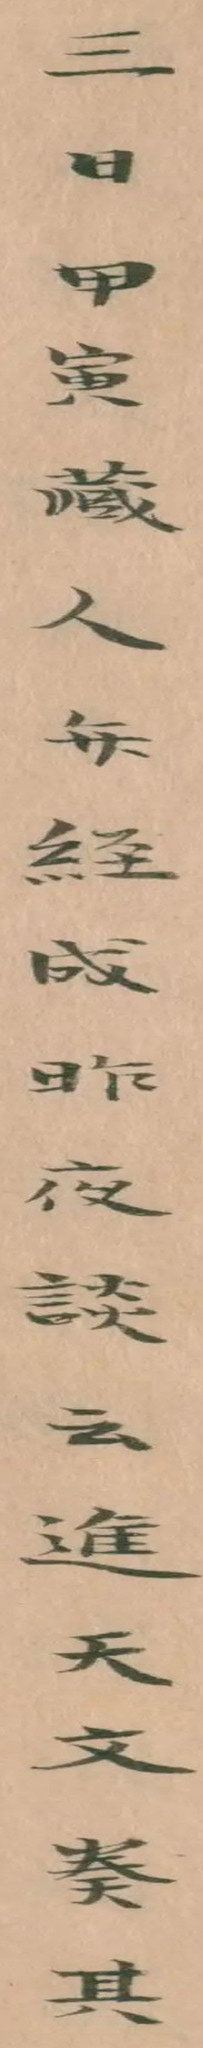三日甲寅蔵人弁経成昨夜談云進天文奏其
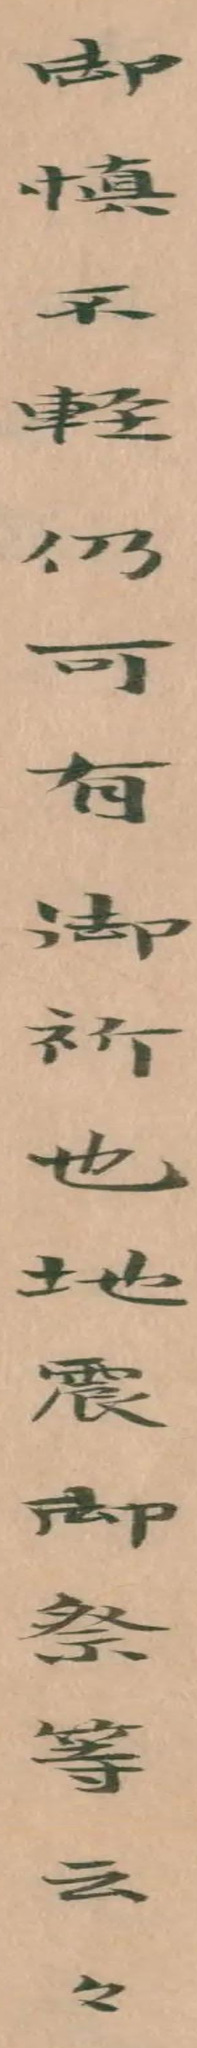御慎不軽仍可有御祈也地震御祭等云々
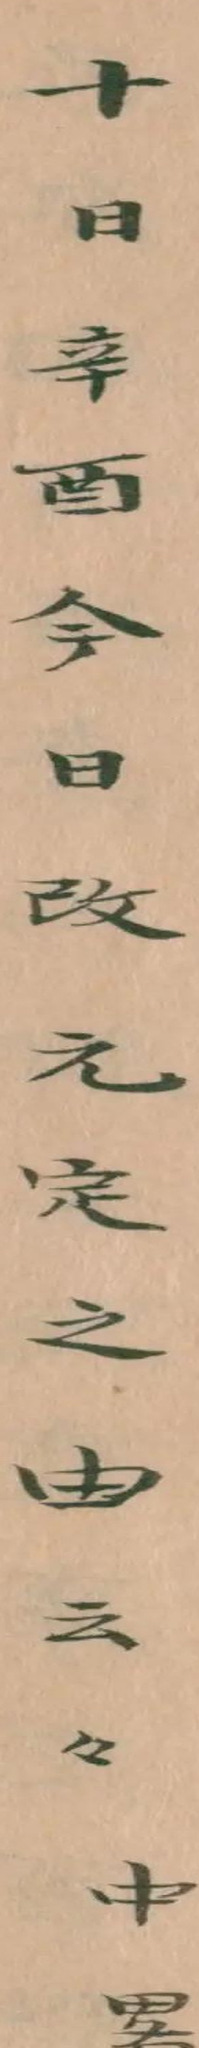十日辛酉今日改元定之由云々中略
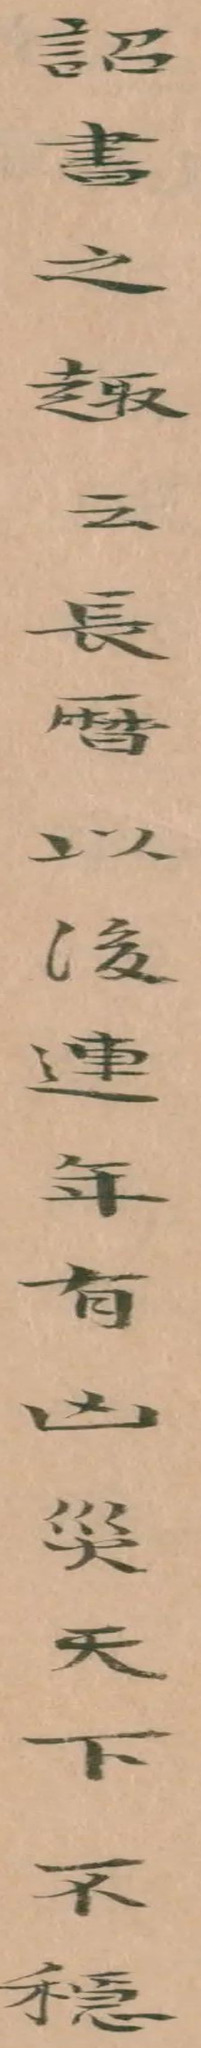詔書之趣云長暦以後連年有凶災天下不穏
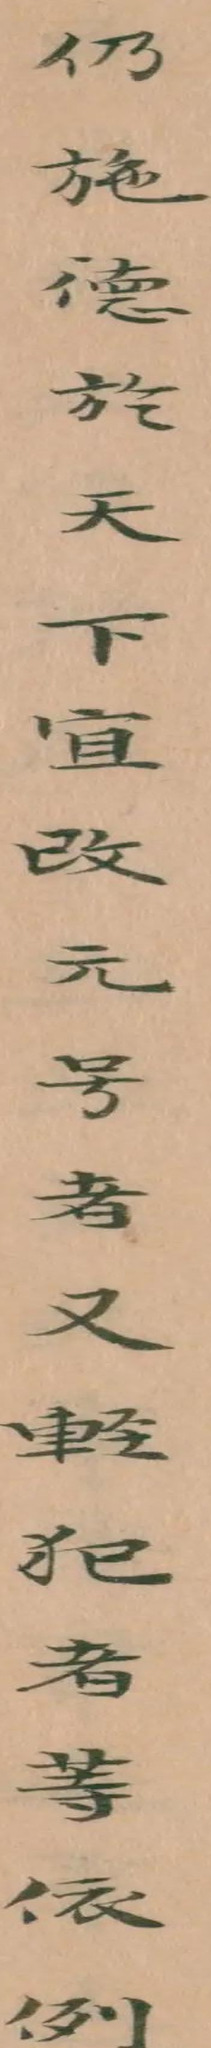仍施徳於天下宜改元号者又軽犯者等依例
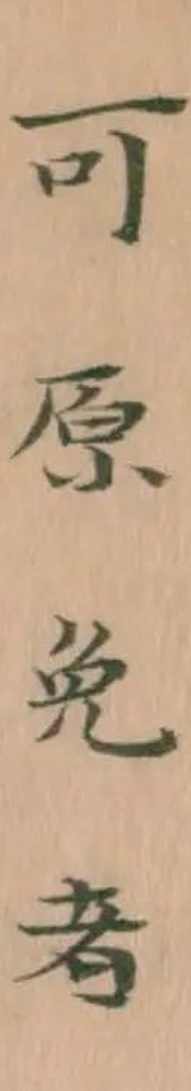可原免者
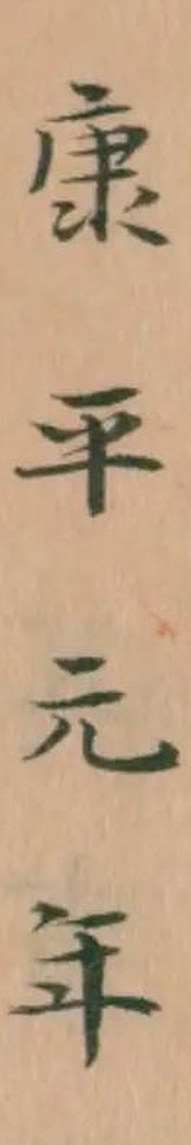康平元年
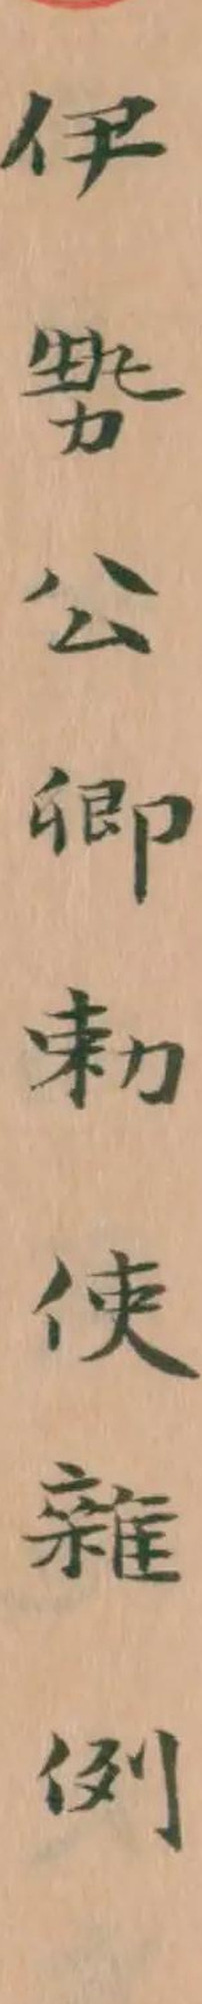○伊勢公卿勅使雑例
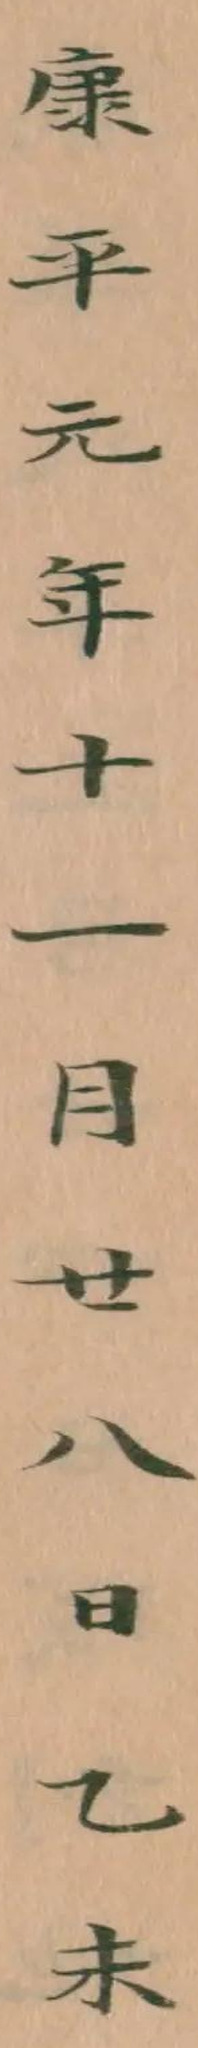康平元年十一月廿八日乙未
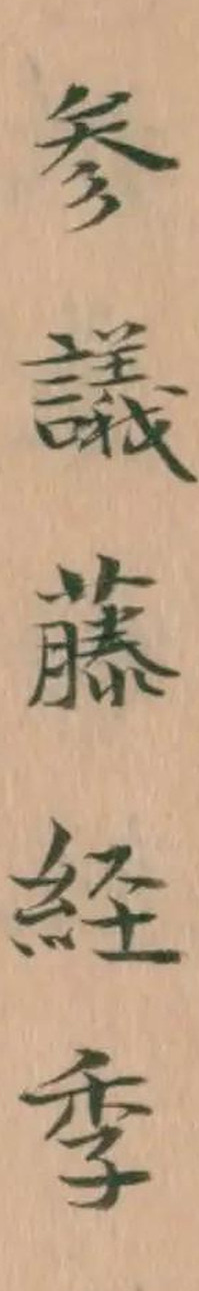参議藤経季
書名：地災撮要. 巻5-6(地震之部)
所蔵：国立国会図書館 National Diet Library, JAPAN
